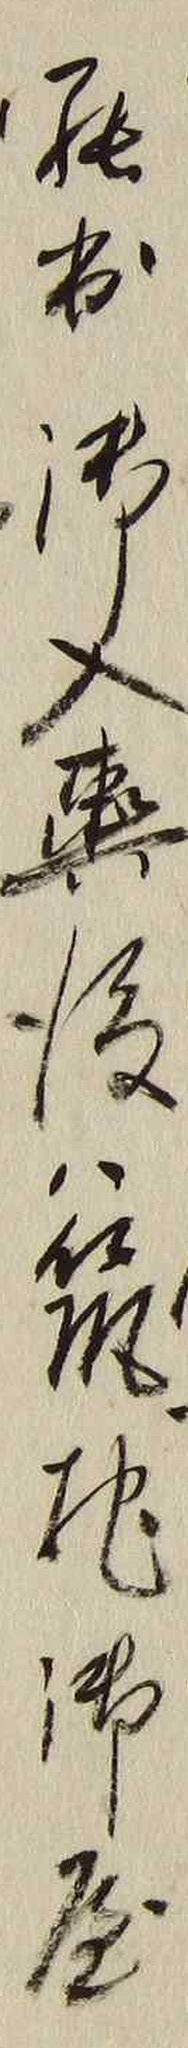罷出御入輿後ハ筑地御屋
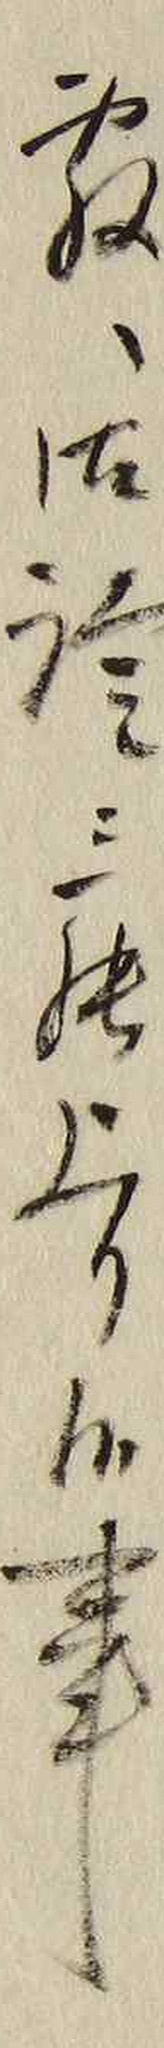敷へ御診ニ罷上り候事

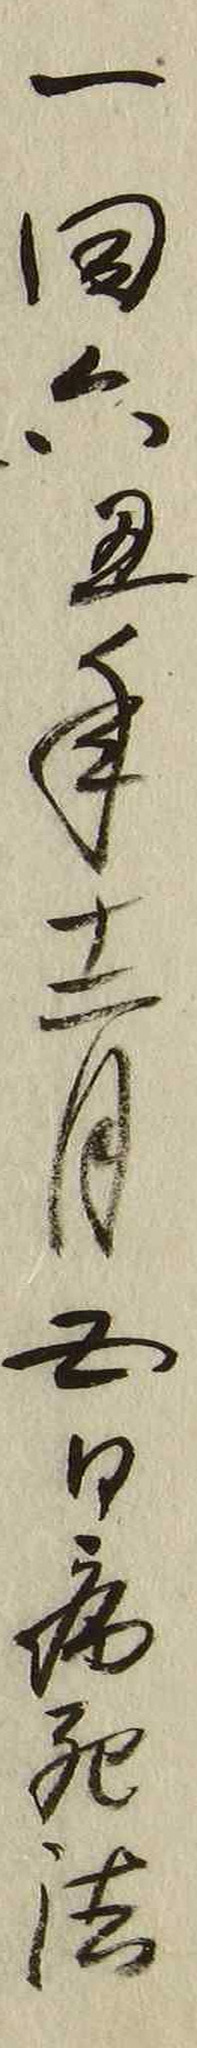一同六丑年十二月五日病死法
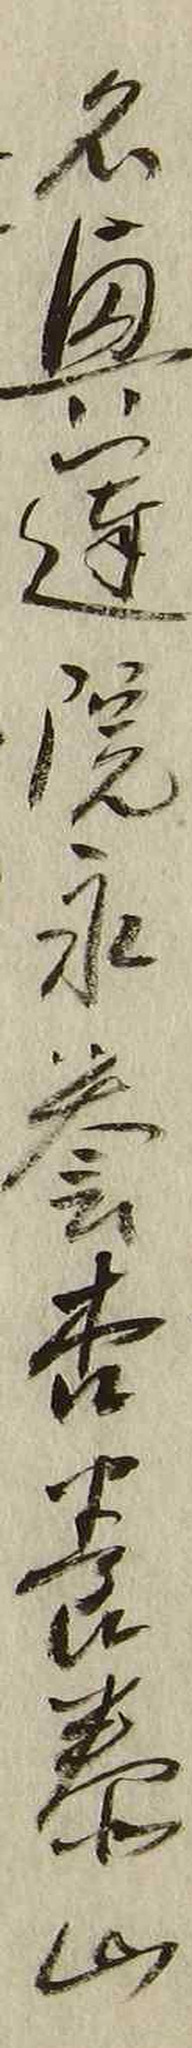名興運院永誉杏養泰山
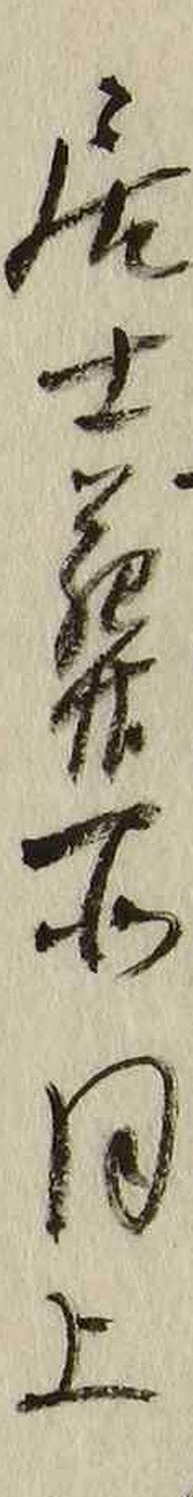居士葬所同上
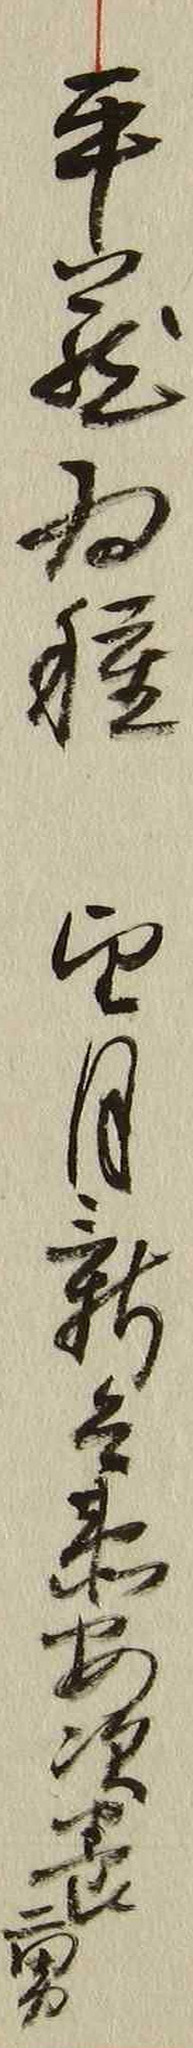平蔵為種望月新兵衛安次養二男
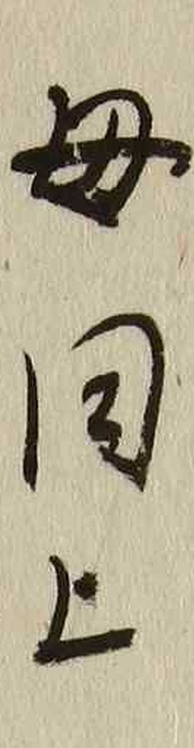母同上
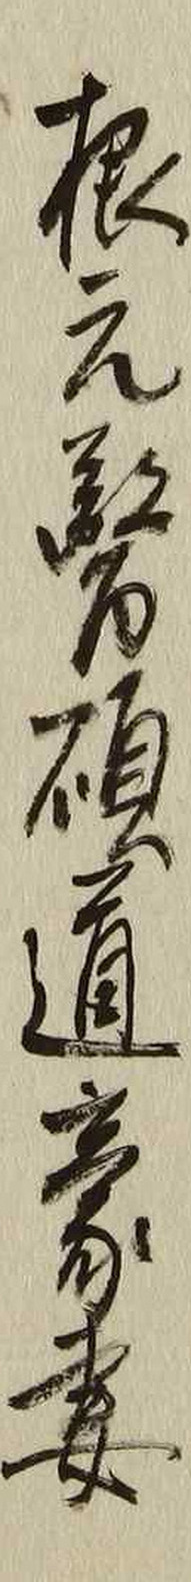女根元医碩道豪妻
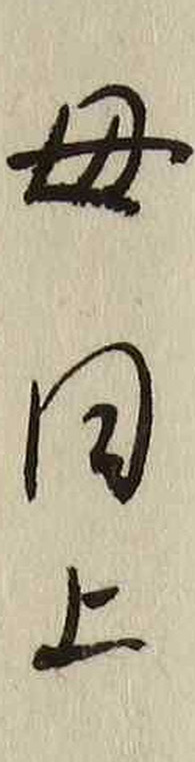母同上
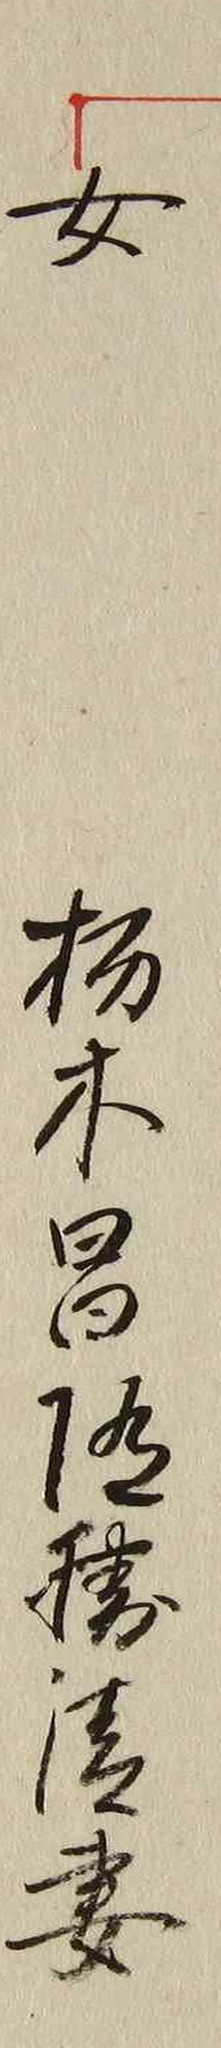女栃木昌随勝清妻
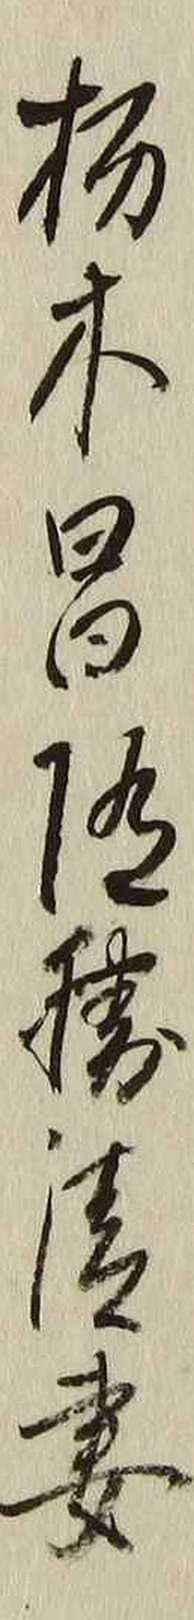女栃木昌随勝清妻
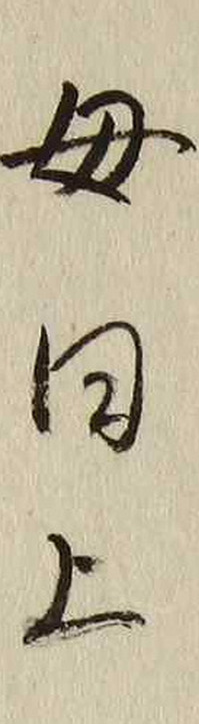母同上
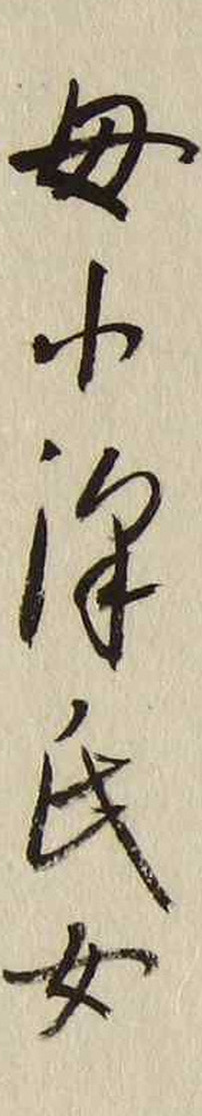母小沢氏女

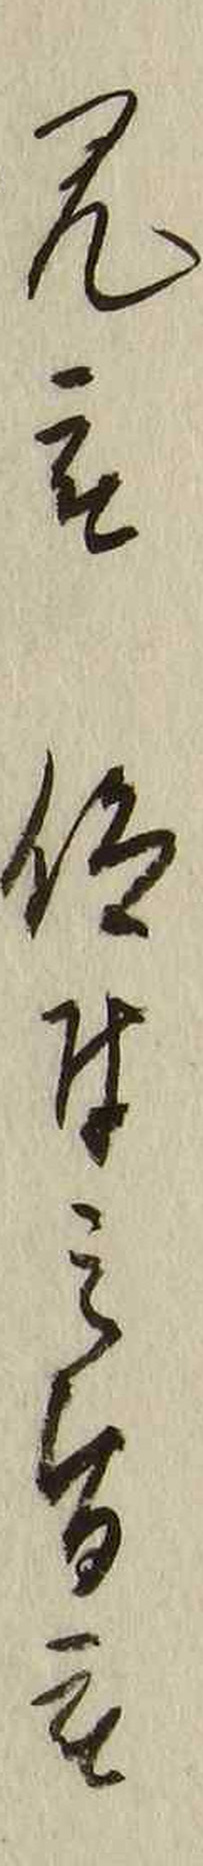見被仰付之旨被
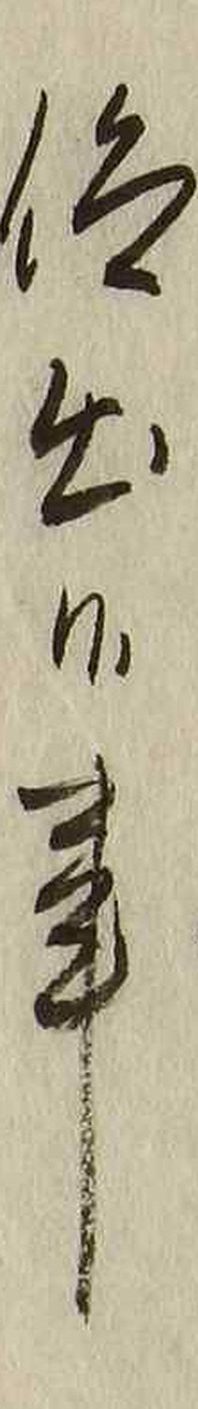仰出候事
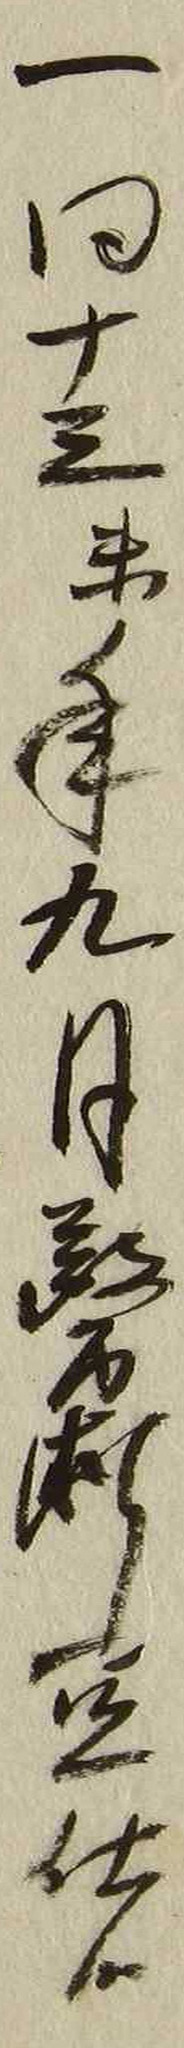一同十三未年九月医術宜仕候
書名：諸士系譜　巻之353　す之部3
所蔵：会津若松市立会津図書館
